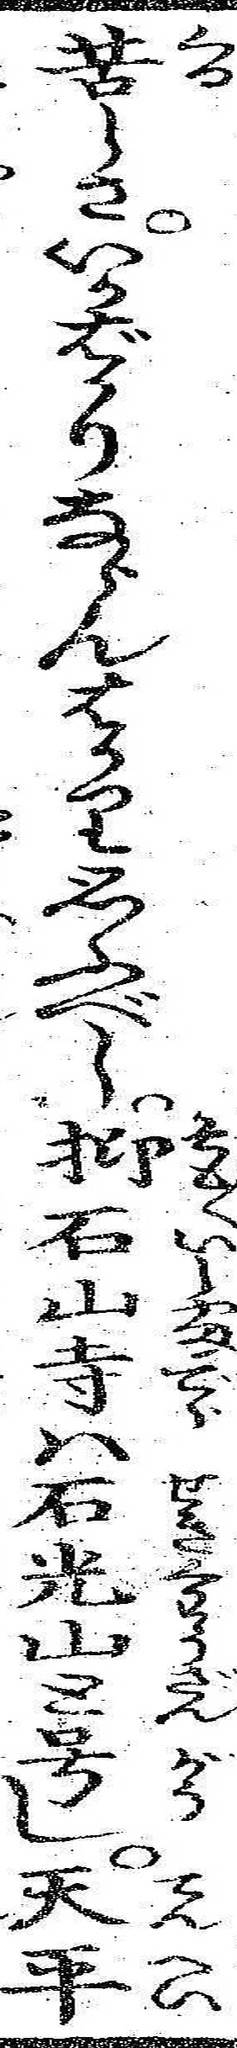苦しさ。いかばかりならんはかり思ふべし。抑石山寺は石光山と号し。天平
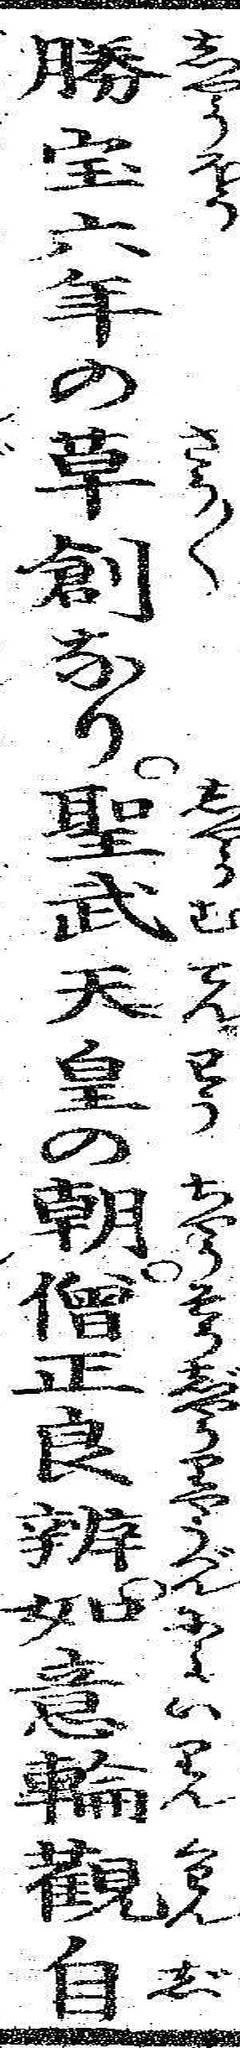勝宝六年の草創なり。聖武天皇の朝。僧正良弁。如意輪観自
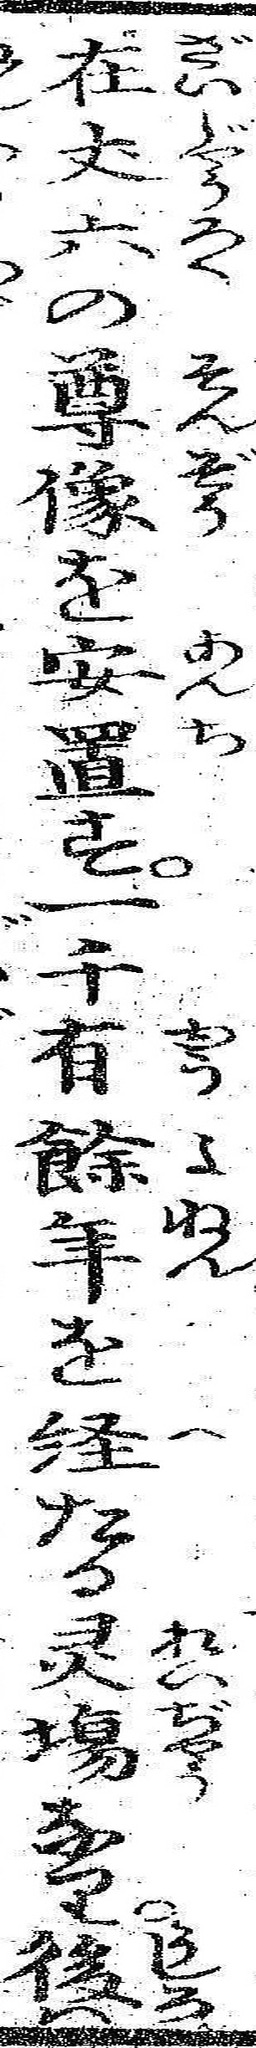在丈六の尊像を安置す。一千有余年を経たる霊場なり。後は
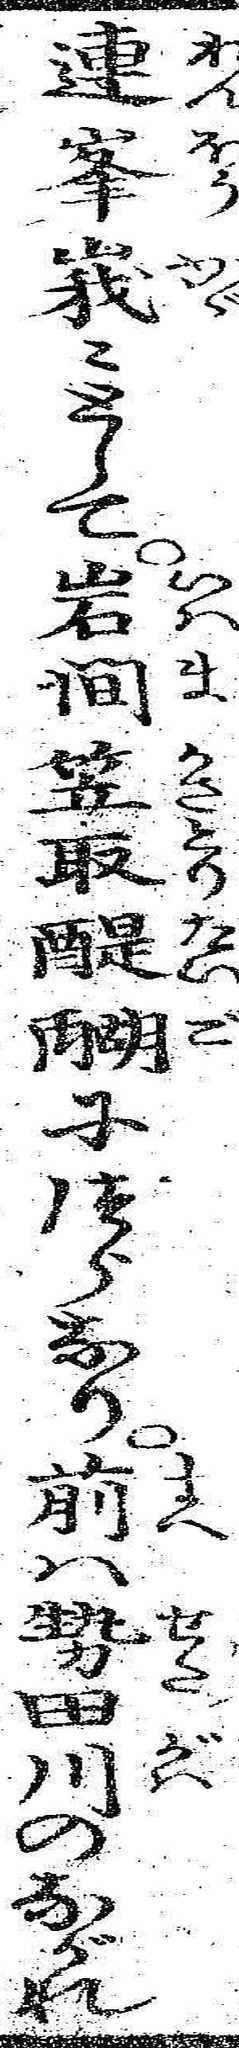連峰峨々として。岩間笠取醍醐につらなり。前は勢田川のながれ）
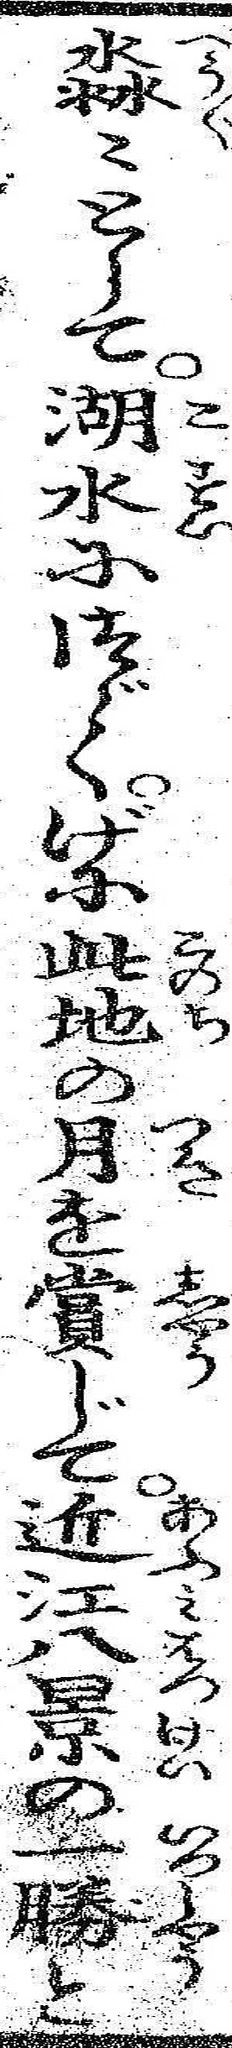淼々として。湖水につゞく。げに此地の月を賞じて。近江八景の一勝と
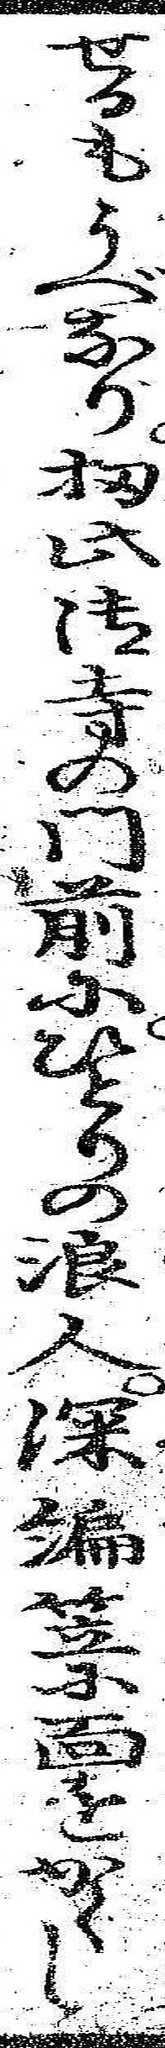せるもうべなり。扨此御寺の門前に。ひとりの浪人。深編笠に面をかくし。

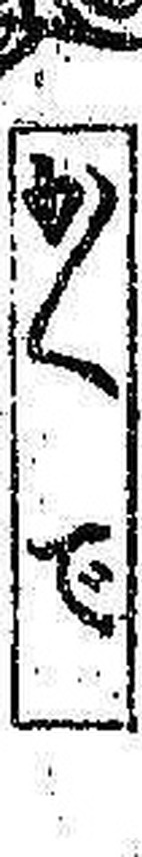かへで
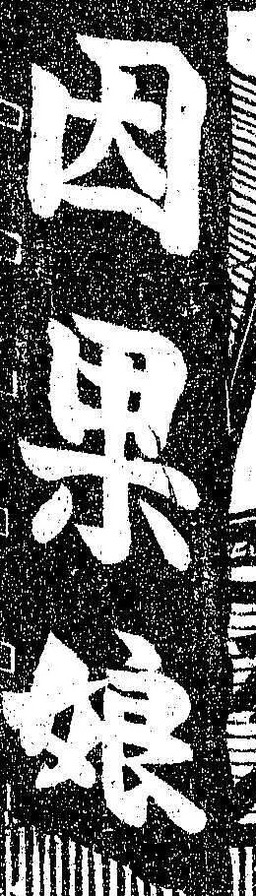因果娘
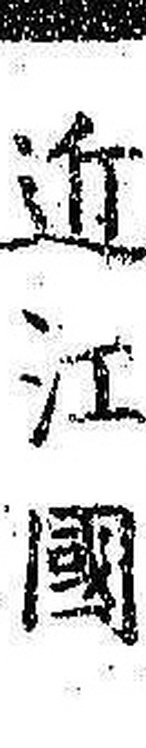近江国
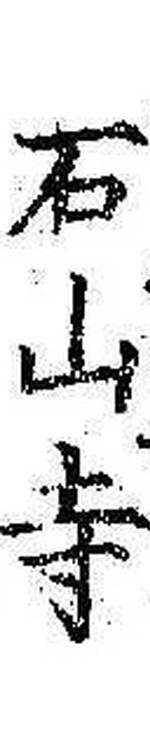石山寺
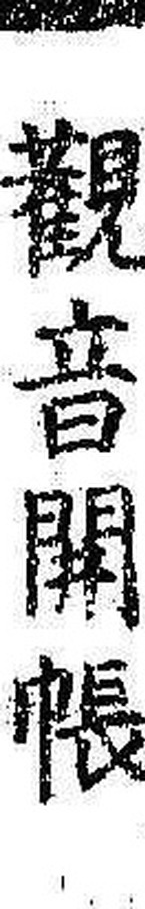観音開帳
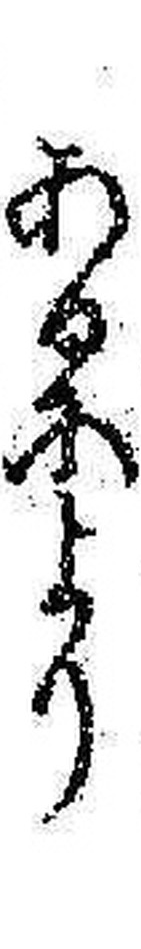あるにより
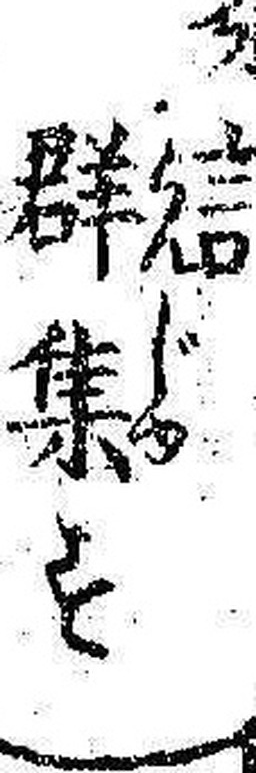群集す
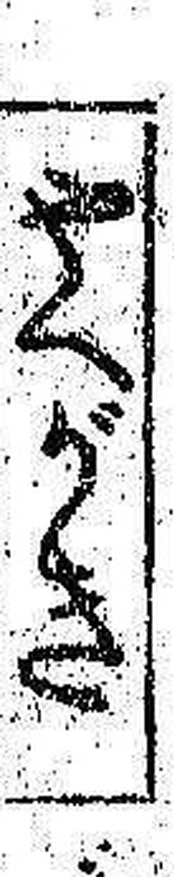やへがき

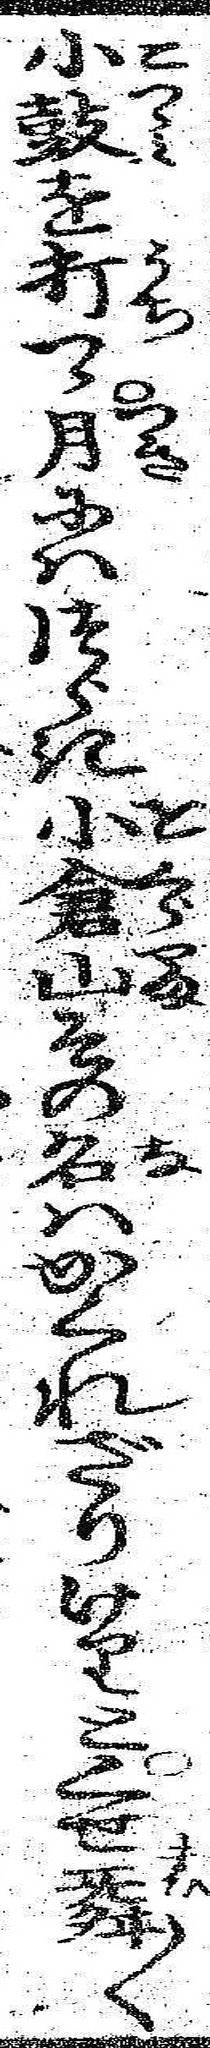小鼓を打つゝ。月にはつらき小倉山その名はかくれざりけりと。くせ舞〳〵
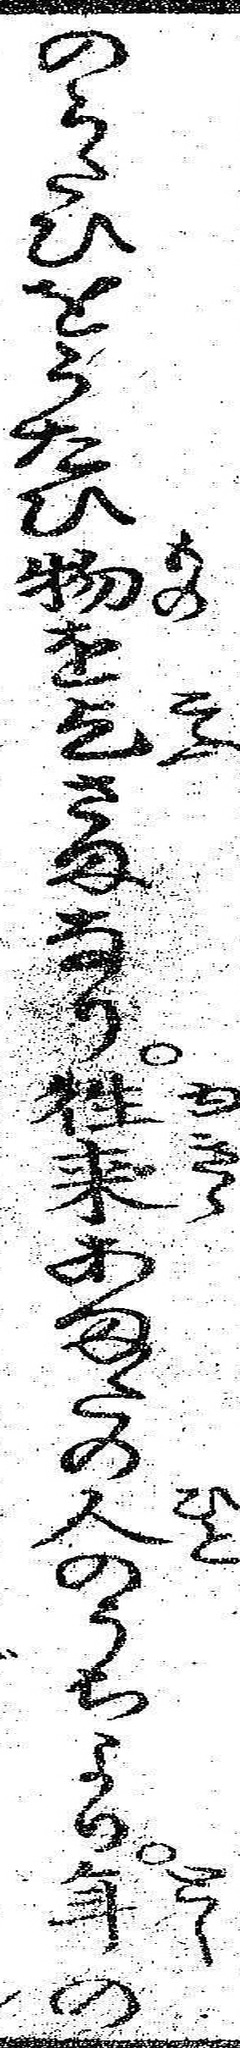のうたひをうたひ物を乞さまなり。往来あまたの人のうちより。年の
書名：昔話稲妻表紙
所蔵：国文学研究資料館
